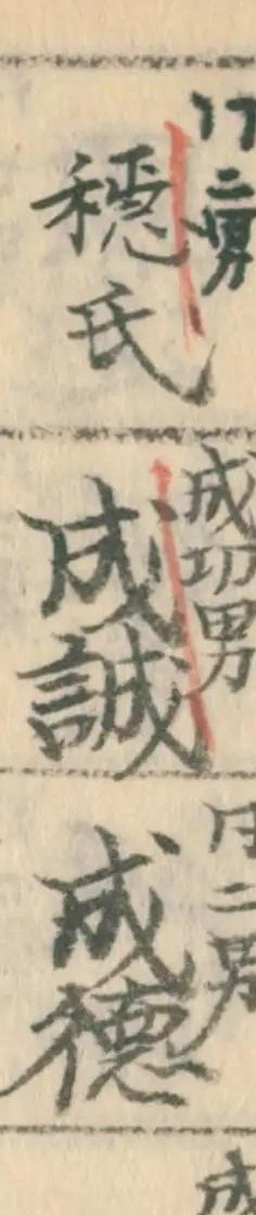穏氏成誠成徳

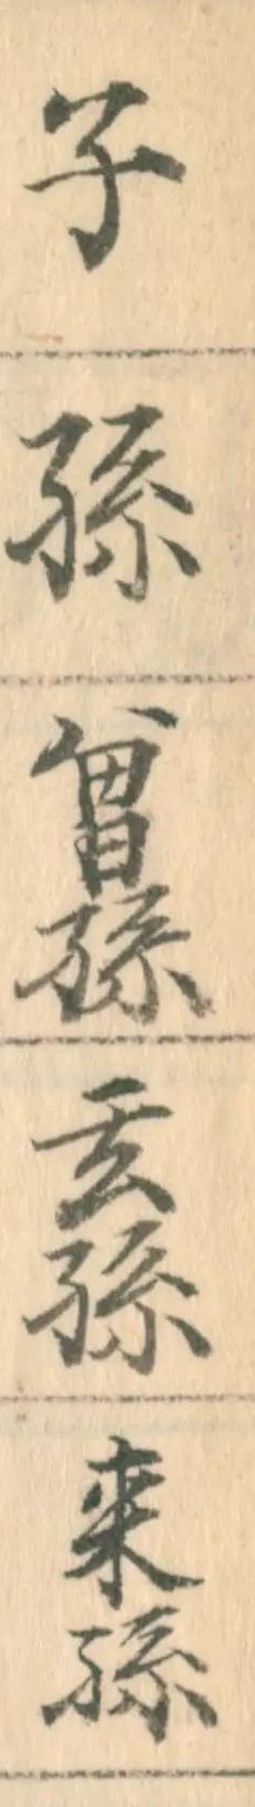子孫曽孫玄孫来孫
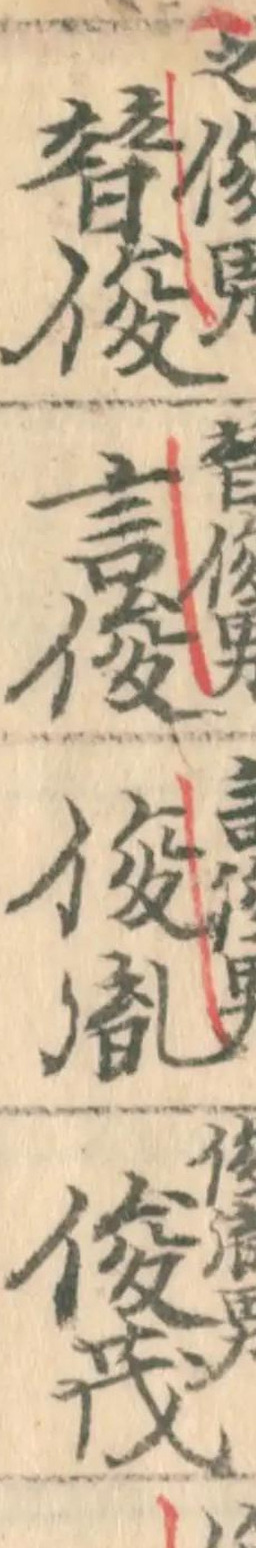暜俊言俊俊胤俊茂
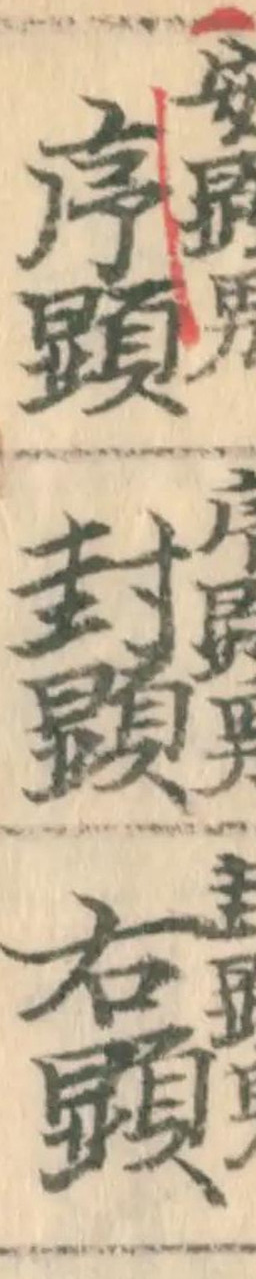序顕封顕右顕
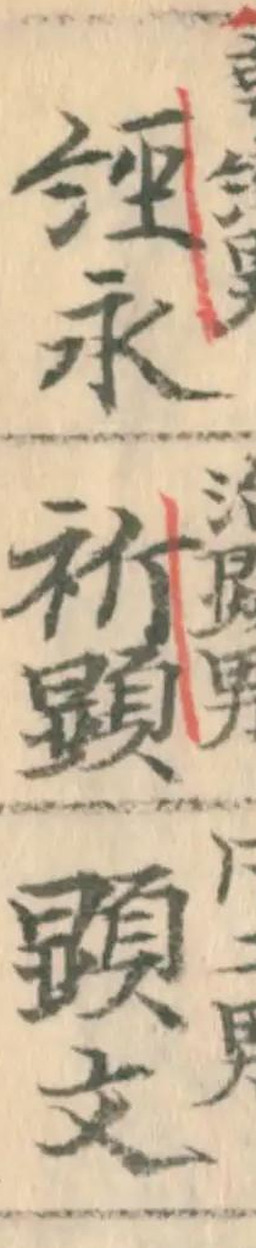経永祈顕顕文
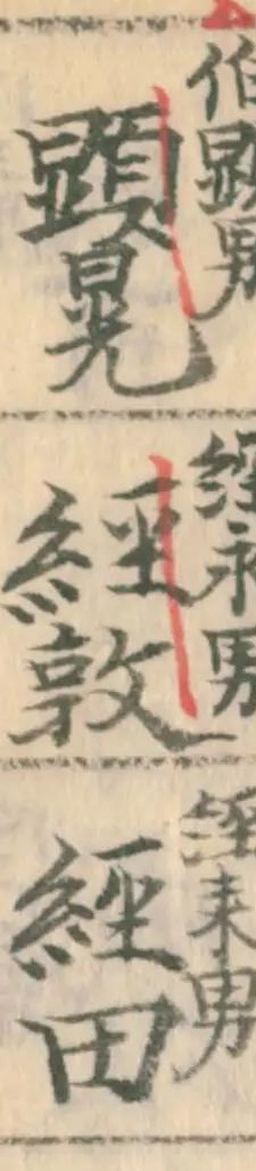顕晃経敦経田
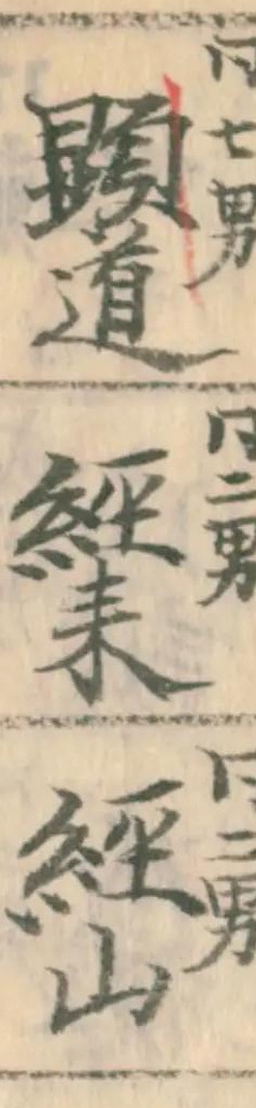顕道経来経山
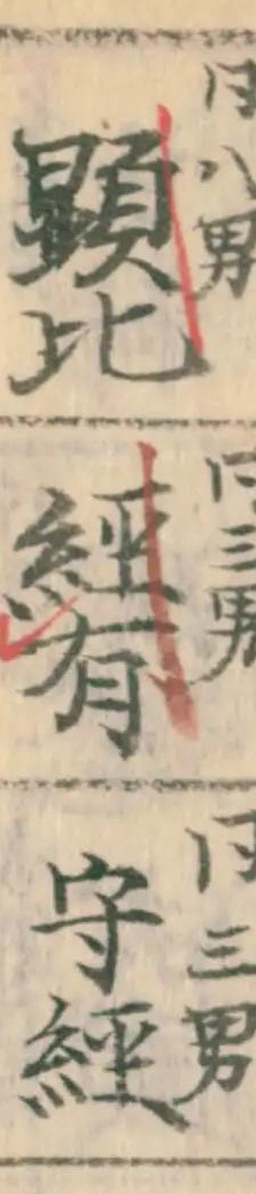顕比経有守経
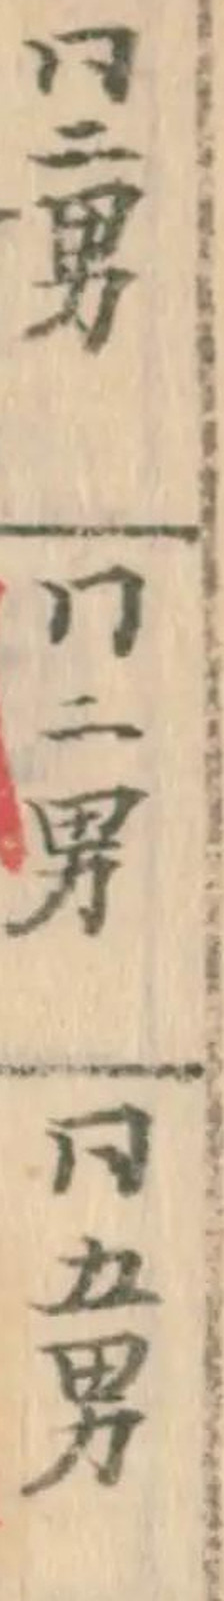同七男同二男同二男
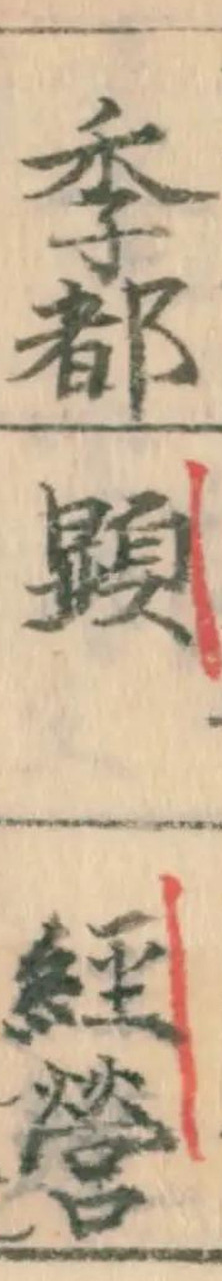季都顕経営
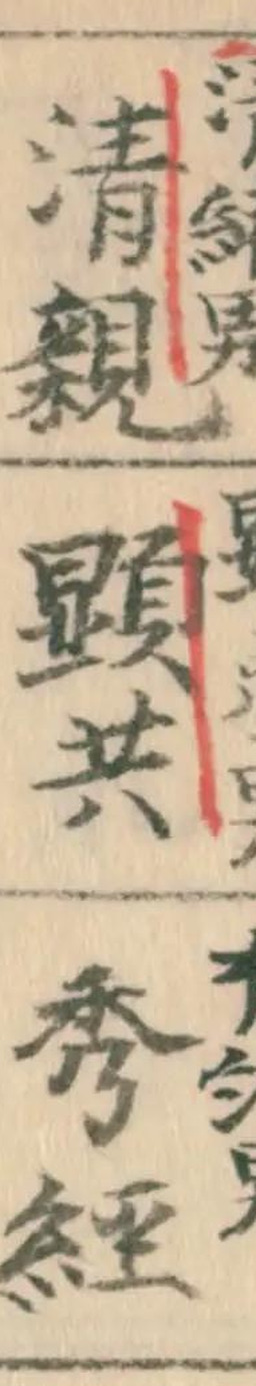清親顕共秀経
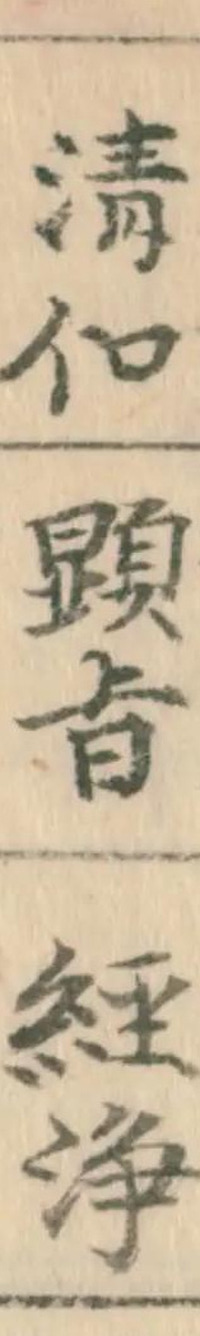清㐰顕旨経浄
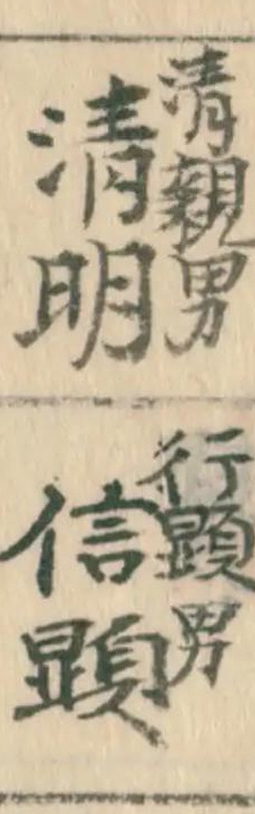清明信顕
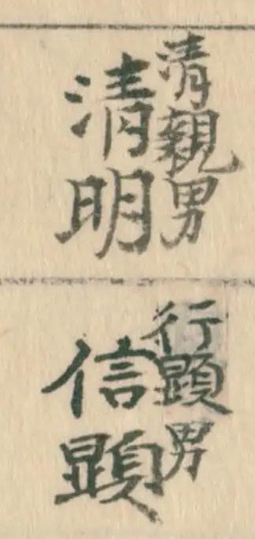清明信顕

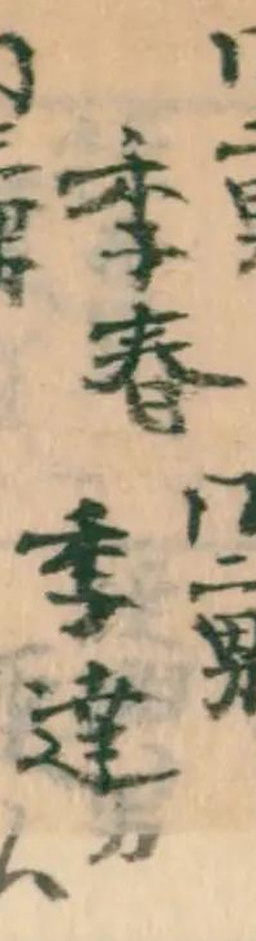季春季達

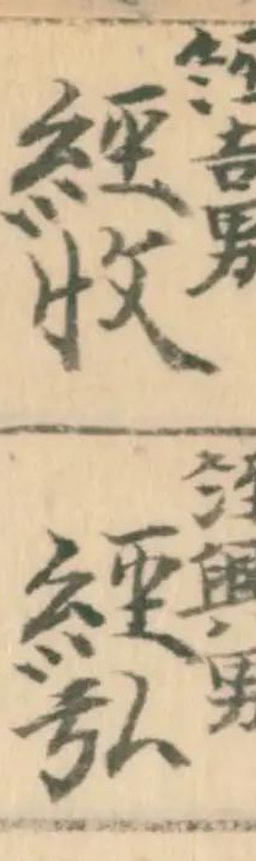経収経弘
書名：賀茂社記録. 第24冊
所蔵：国立国会図書館 National Diet Library, JAPAN
